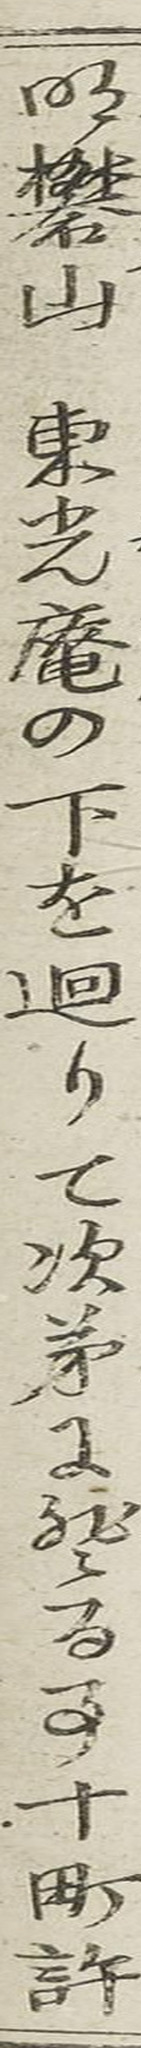明礬山東光庵の下を廻りて次第に登る事十町許
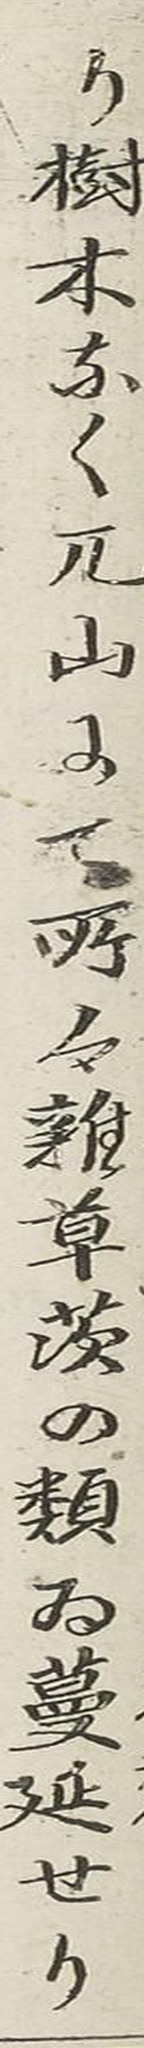り樹木なく兀山にて所々雑草茨の類ゐ蔓延せり
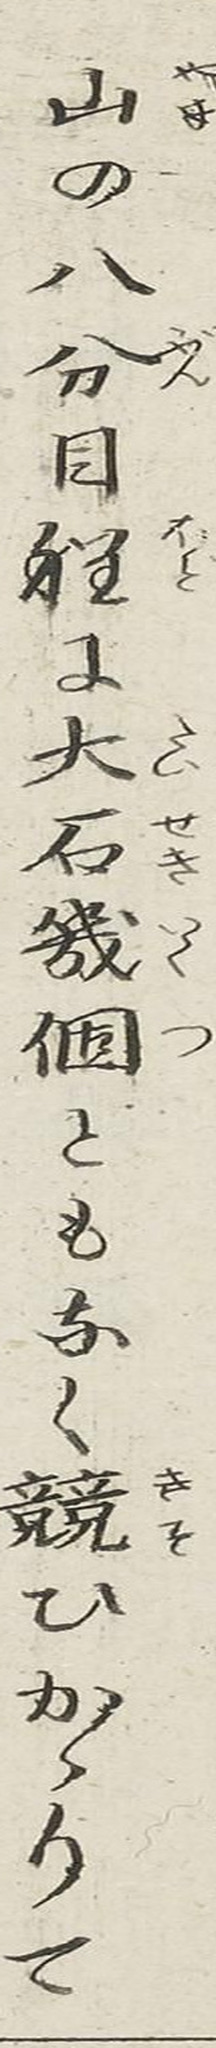山の八分目程に大石幾個ともなく競ひかゝりて
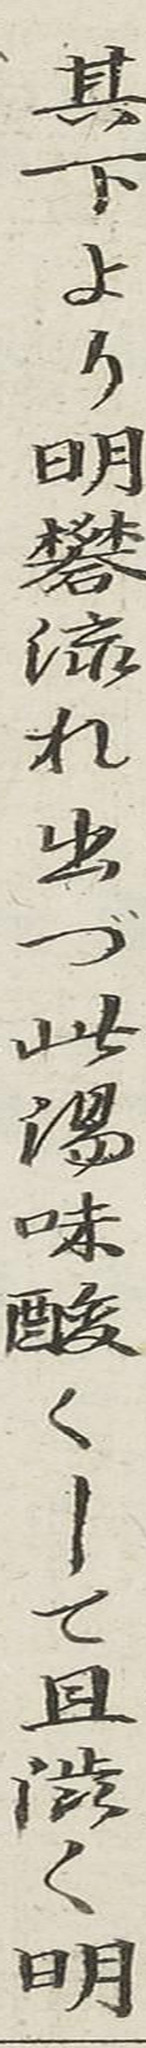其下より明礬流れ出づ此湯味酸くして且渋く明
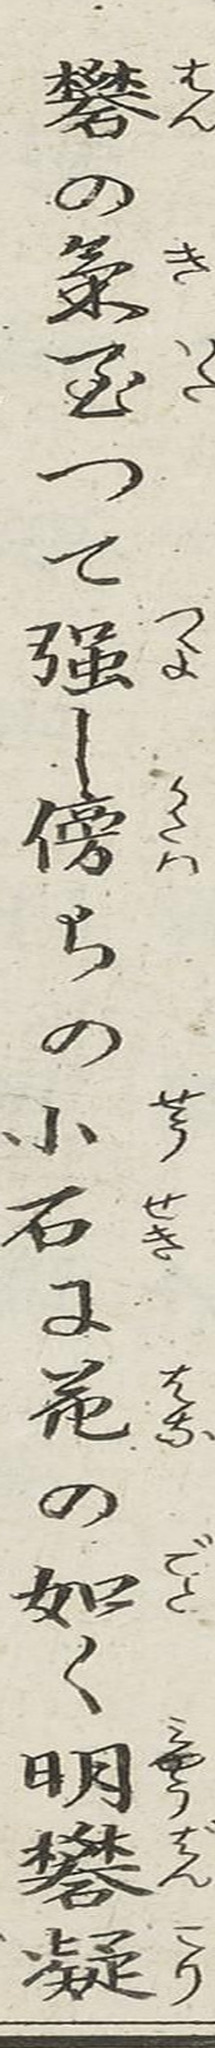礬の気至つて強し傍らの小石に花の如く明礬凝
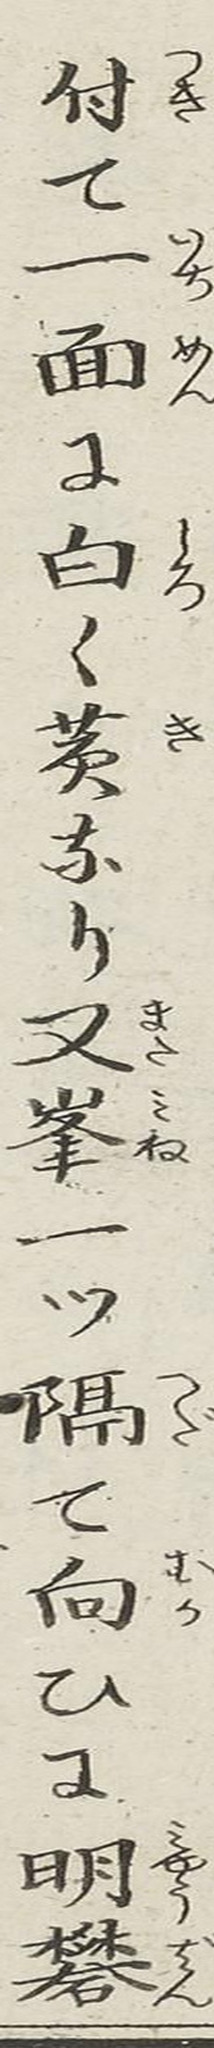付て一面に白く黄なり又峯一つ隔て向ひに明礬
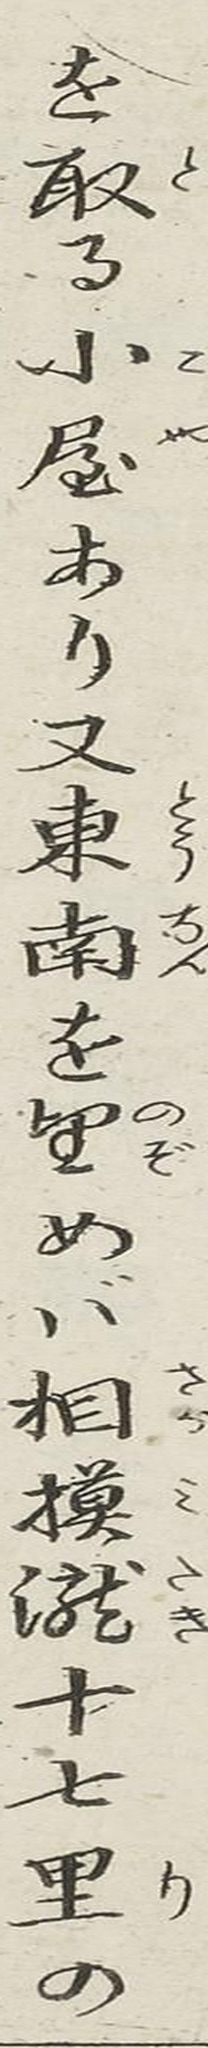を取る小屋あり又東南を望めば相模瀧十七里の
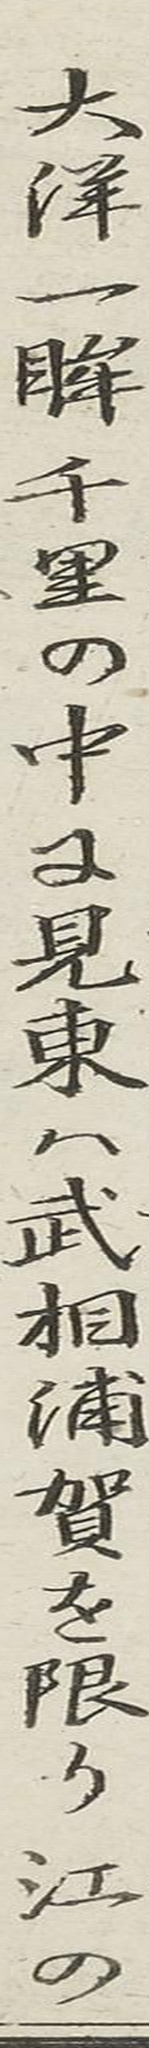大洋一眸千里の中に見東は武相浦賀を限り江の
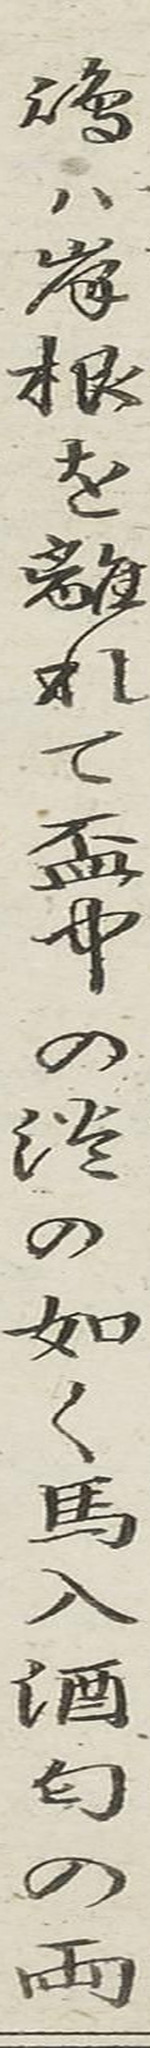島は岸根を離れて盃中の淡の如く馬入酒匂の両
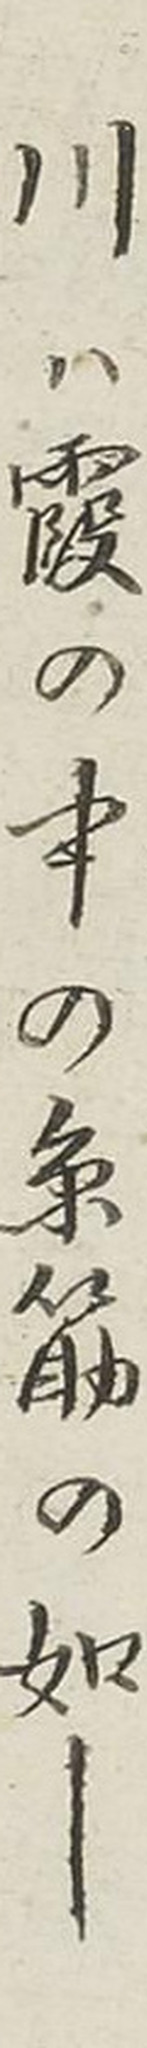川は霞の中の糸筋の如し
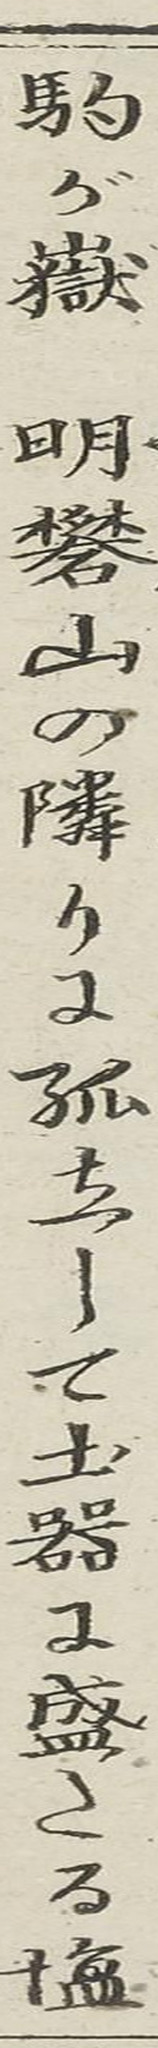駒が嶽明礬山の隣りに孤立して土器に盛たる塩

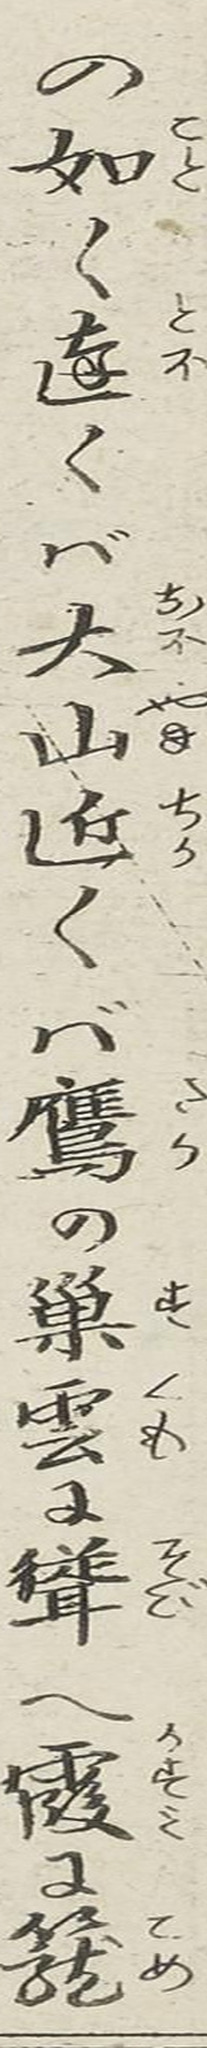の如く遠くば大山近くば鷹の巣雲に聳へ霞に籠
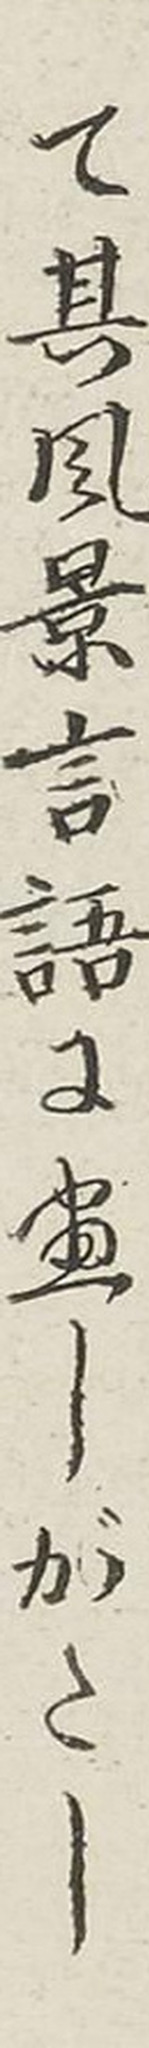て其風景言語に盡しがたし
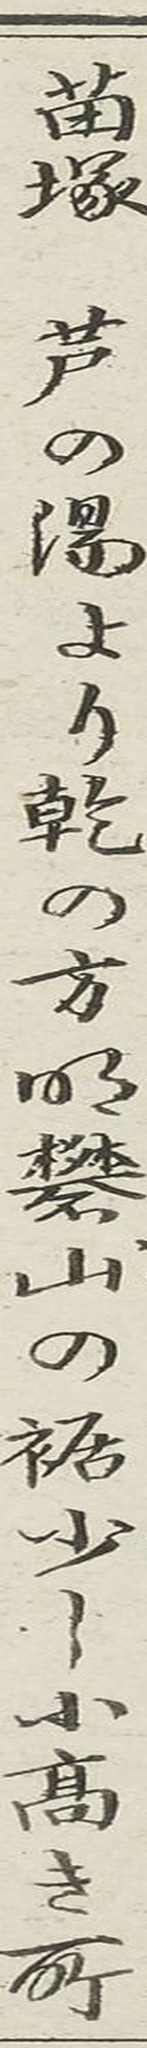笛塚芦の湯より乾の方明礬山の裾少し小高き所
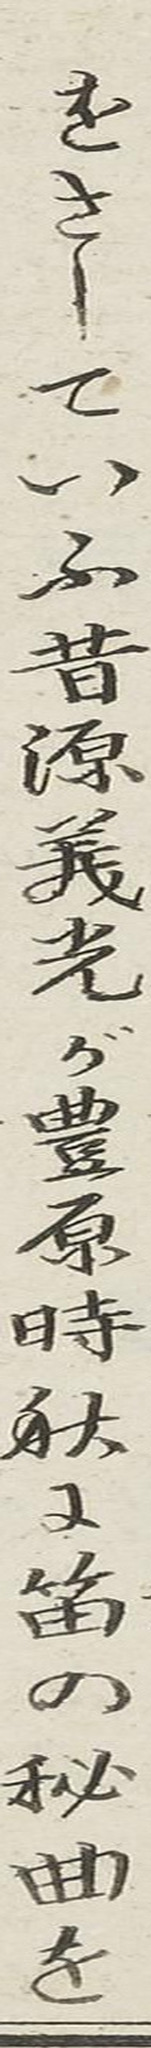をさしていふ昔源義光が豊原時秋に笛の秘曲を
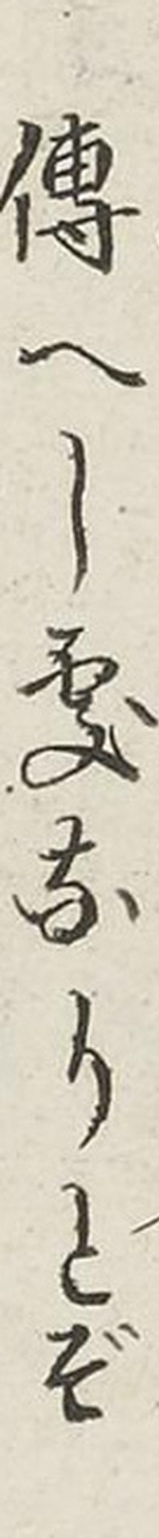伝へし處なりとぞ
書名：箱根温泉誌　全
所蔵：東京大学地震研究所図書室 Earthquake Research Institute Library, The University of Tokyo, JAPAN
